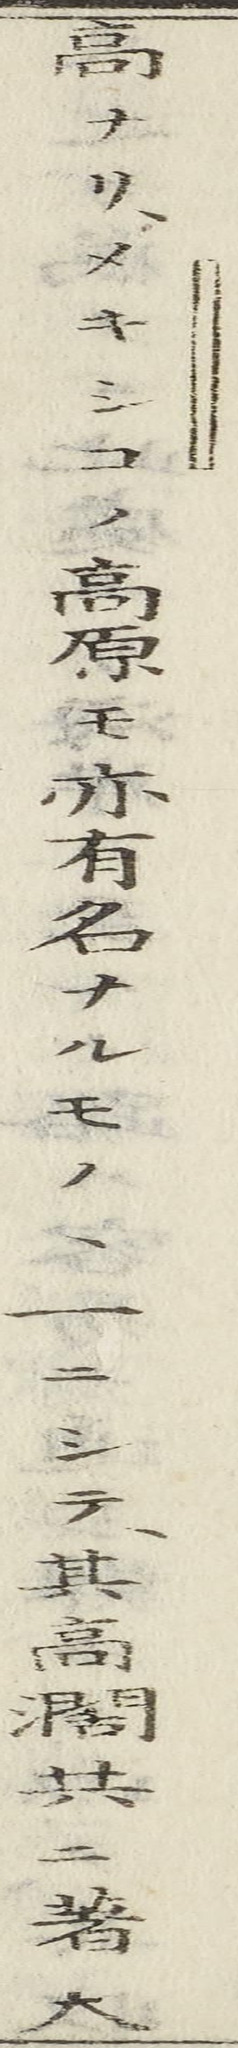高ナリ、メキシコノ高原モ亦有名ナルモノヽ一ニシテ、其高濶共ニ著大
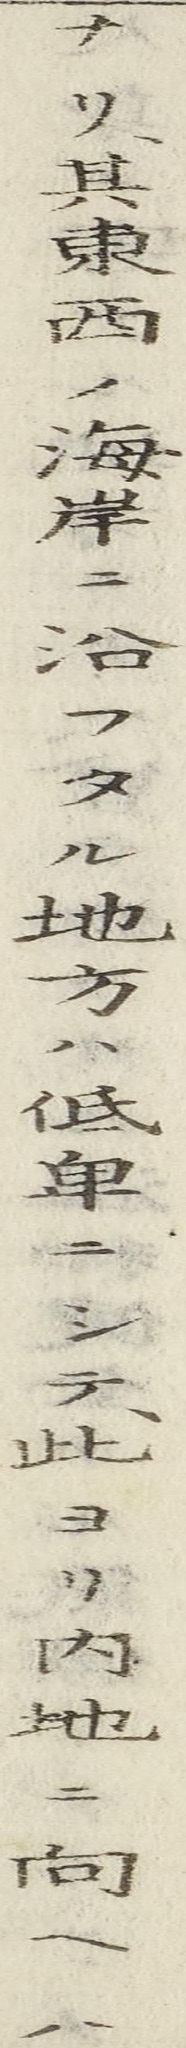ナリ、其東西ノ海岸ニ沿フタル地方ハ低卑ニシテ、此ヨリ内地ニ向ヘハ
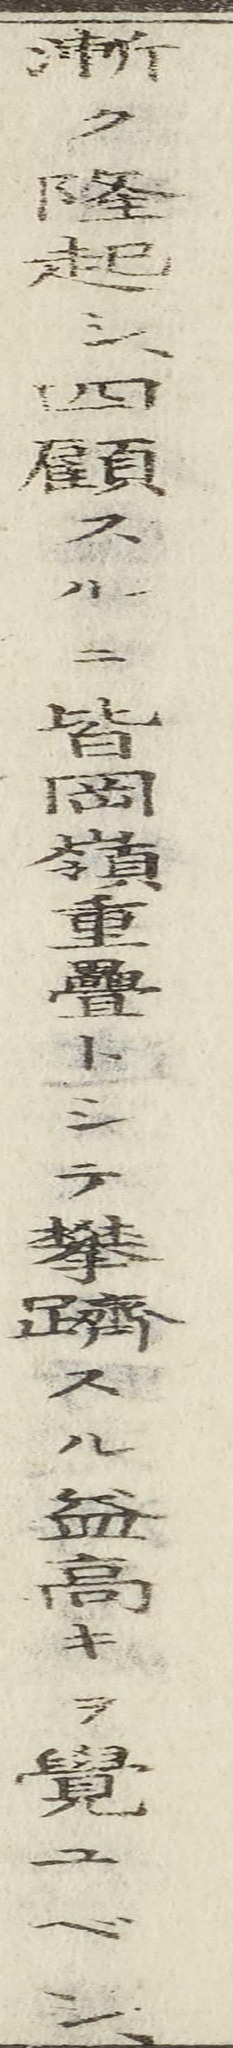漸ク隆起シ、四顧スルニ皆岡嶺重畳トシテ挙躋スル益高キヲ覚ユベシ、
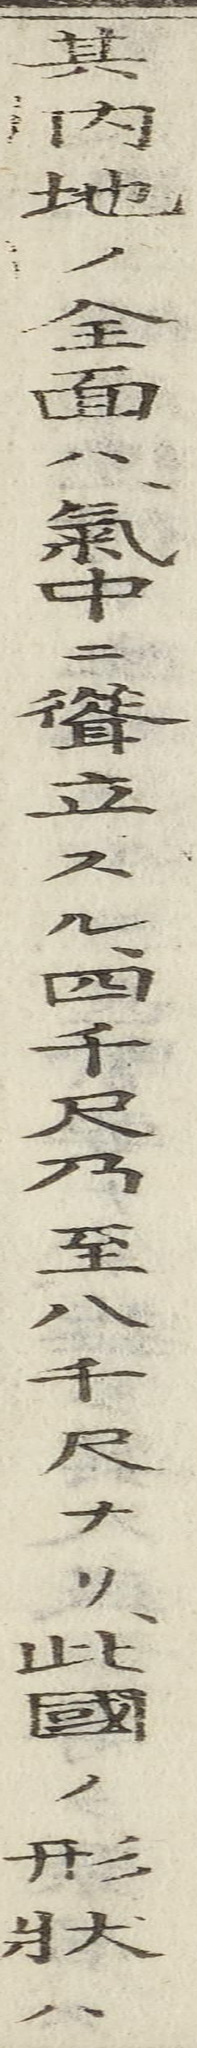其内地ノ全面ハ、気中ニ聳立スル、四千尺乃至八千尺ナリ、此国ノ形状ハ

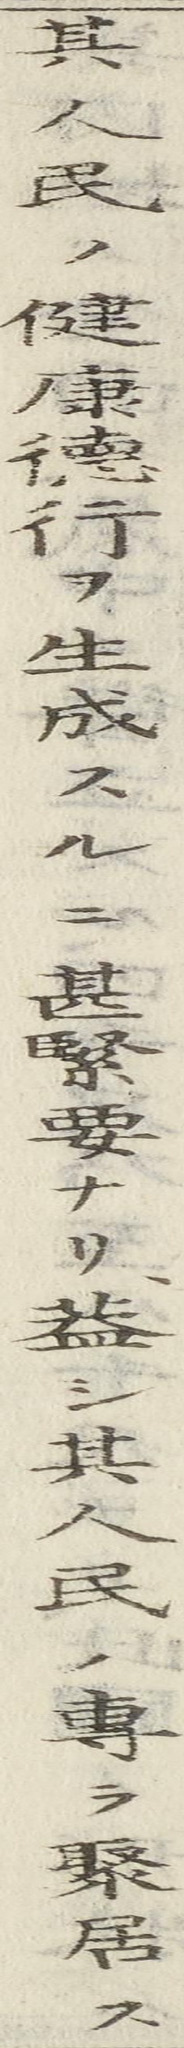其人民ノ健康徳行ヲ生成スルニ甚緊要ナリ、蓋シ其人民ノ専ラ聚居ス
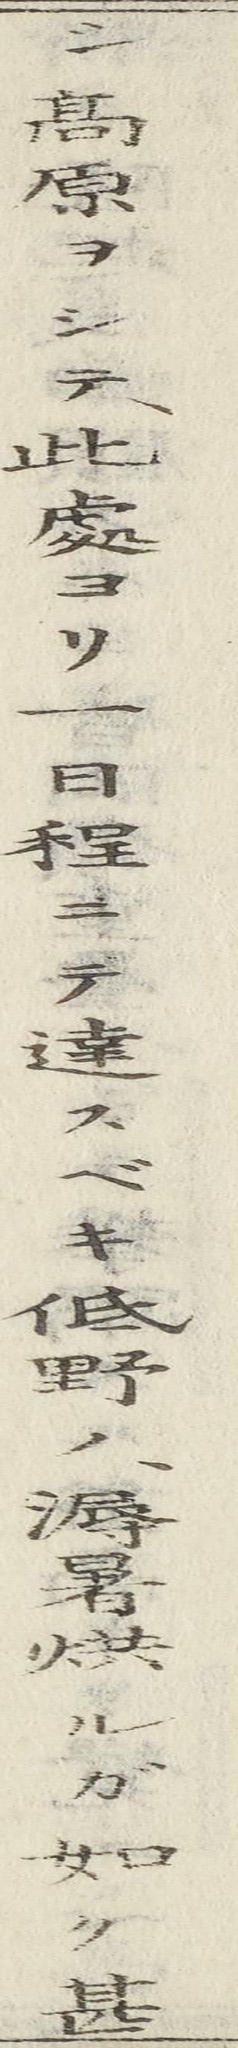シ高原ヲシテ、此処ヨリ一日程ニテ達スベキ低野ノ、溽暑烘ルガ如ク甚
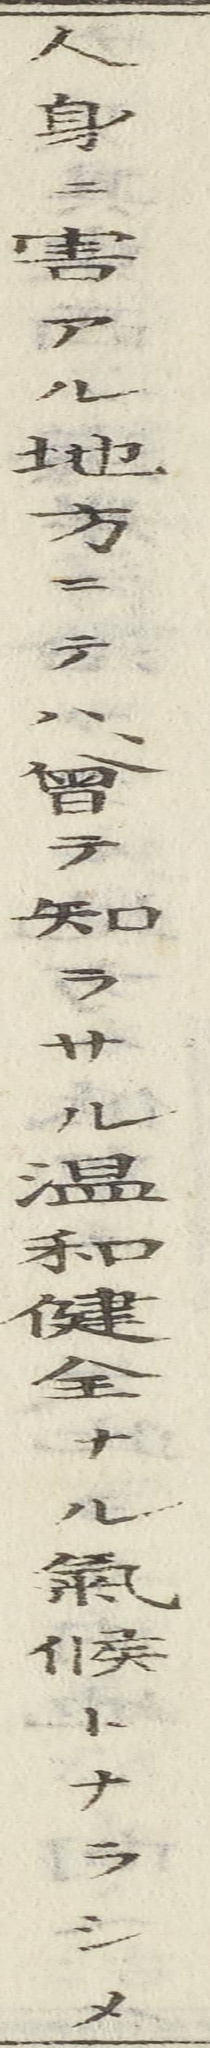人身ニ害アル地方ニテハ、嘗テ知ラサル温和健全ナル気候トナラシメ
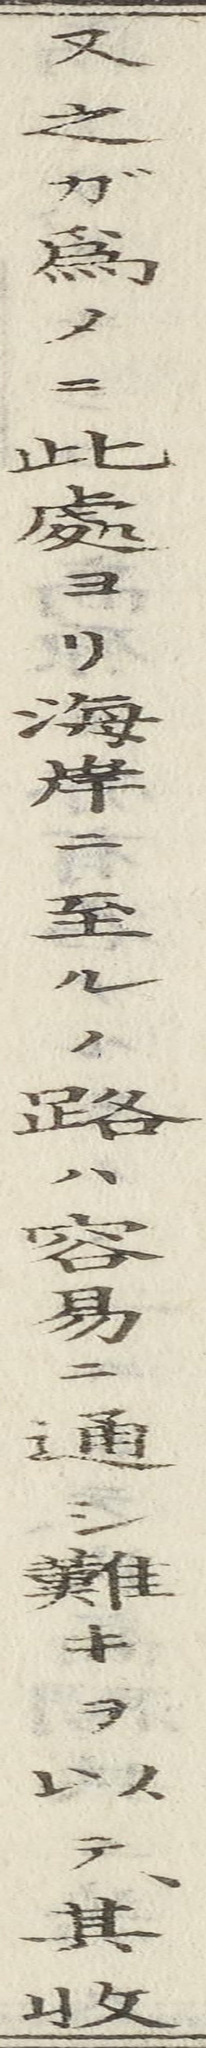又之ガ為メニ此処ヨリ海岸ニ至ルノ路ハ容易ニ通シ難キヲ以テ、其収
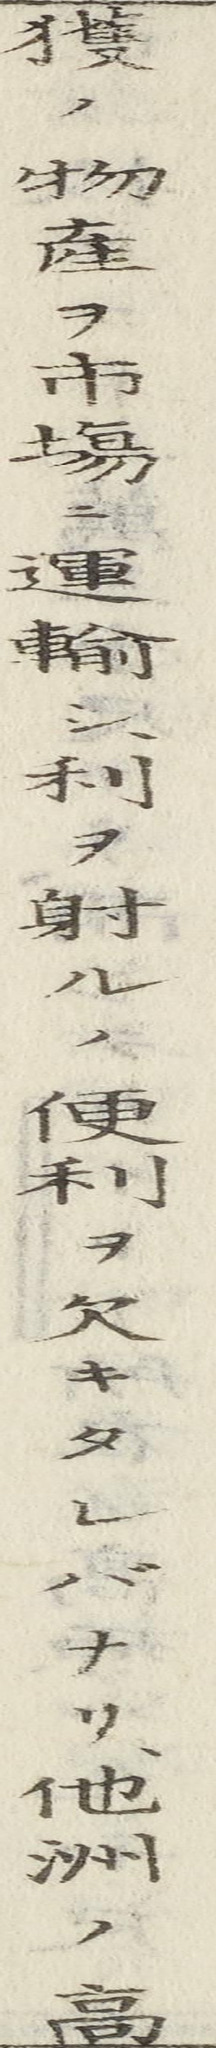穫ノ物産ヲ市場ニ運輸シ、利ヲ射ルノ便利ヲ欠キタレバナリ、他洲ノ高
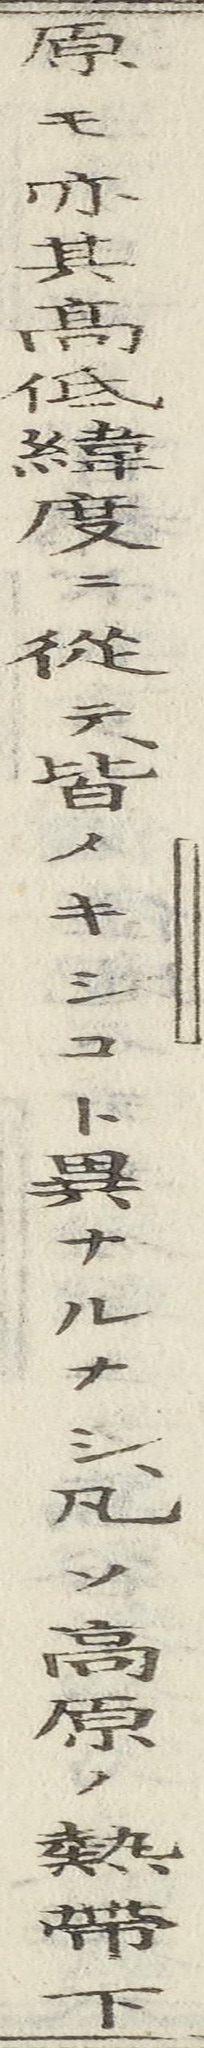原モ亦其高低緯度ニ従テ、皆メキシコト異ナルナシ、凡ソ高原ノ熱帯下
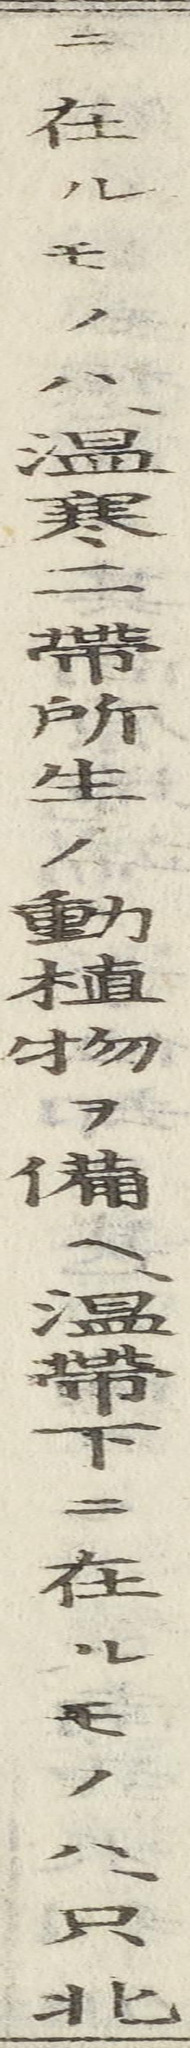ニ在ルモノハ、温寒二帯所生ノ動植物ヲ備ヘ、温帯下ニ在ルモノハ、只北
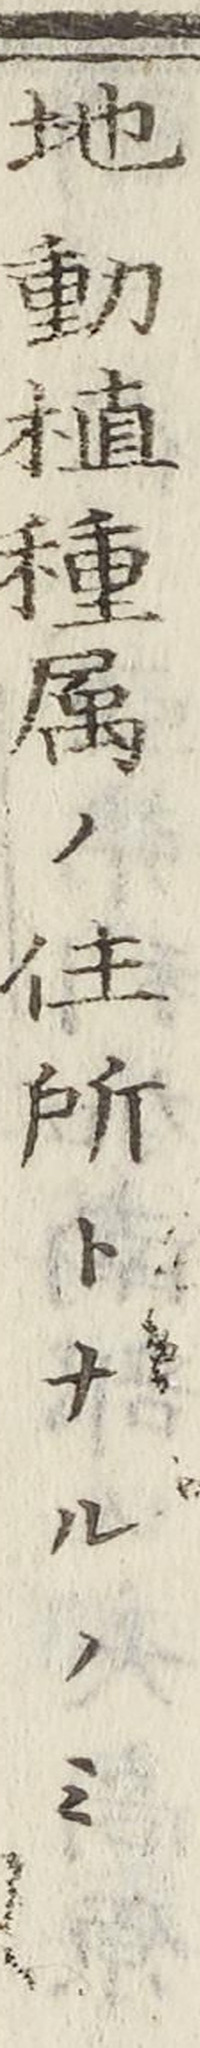地動植種属ノ住所トナルノミ
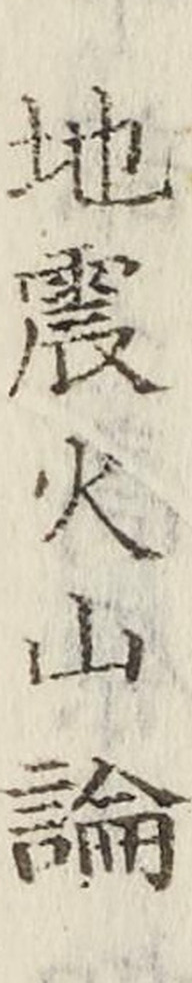地震火山論
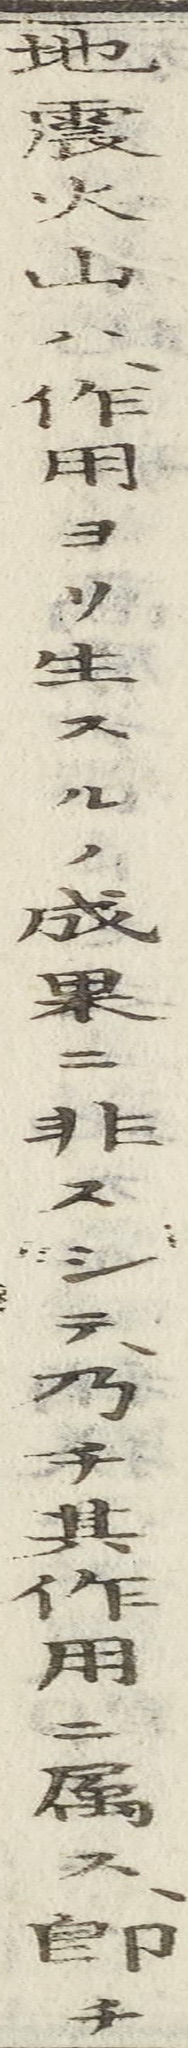地震火山ハ、作用ヨリ生スルノ成果ニ非スシテ、乃チ其作用ニ属ス、即チ
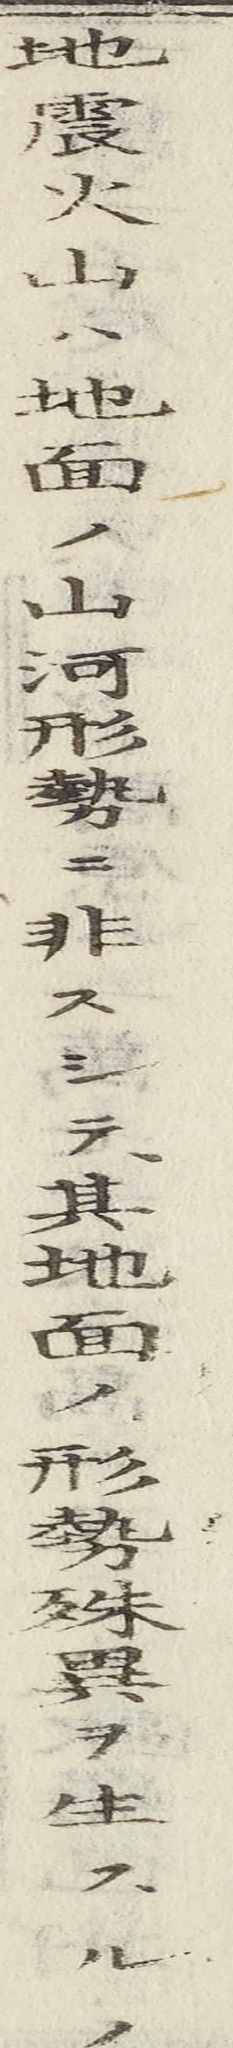地震火山ハ地面ノ山河形勢ニ非スシテ、其地面ノ形勢殊異ヲ生スルノ
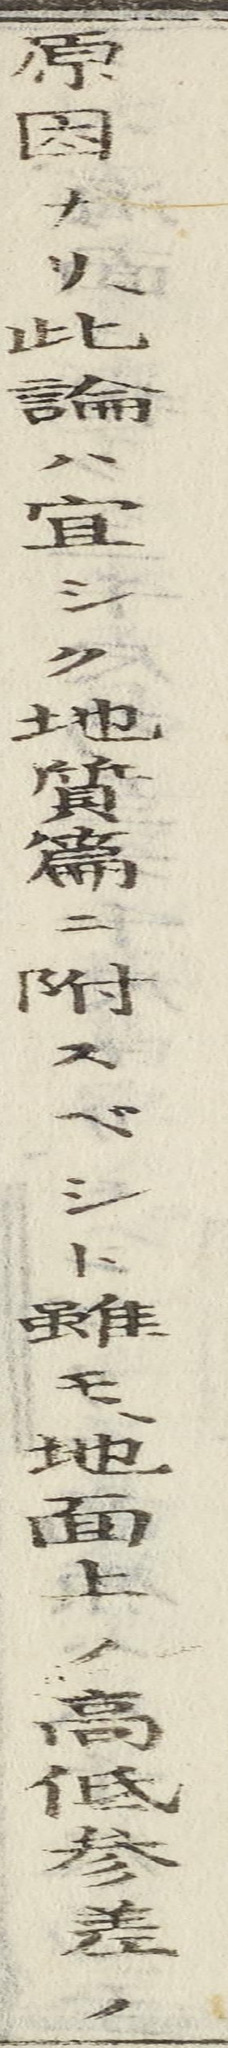原因ナリ、此論ハ宜シク地質篇ニ附スベシト雖モ、地面上ノ高低参差ノ
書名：百科全書　地文學　全
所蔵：東京大学地震研究所図書室 Earthquake Research Institute Library, The University of Tokyo, JAPAN
